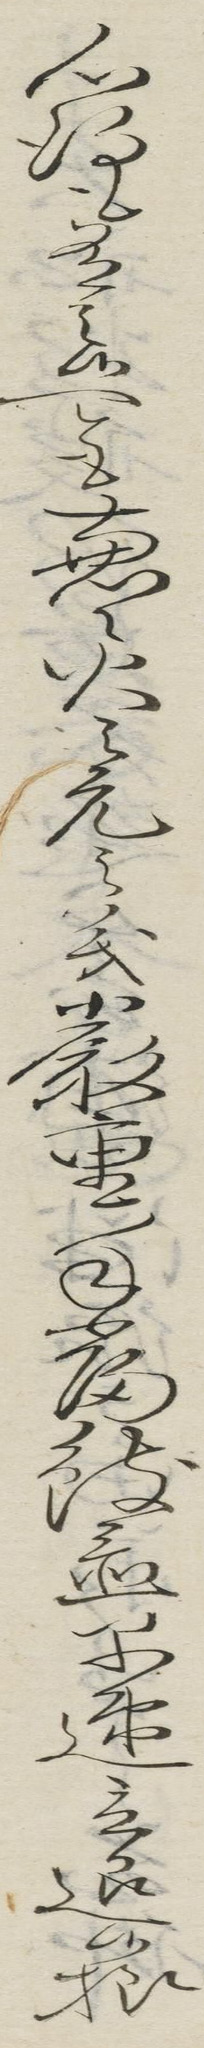心得も有之候へとも兼々火之元之義厳重手当致置早速立退候様
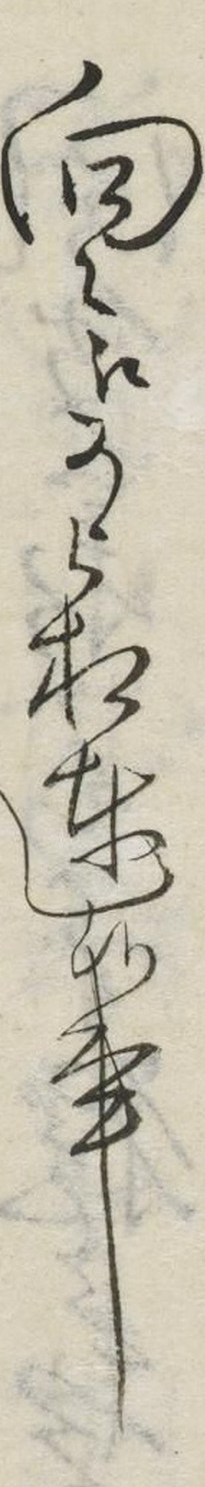向々え可被相達候事
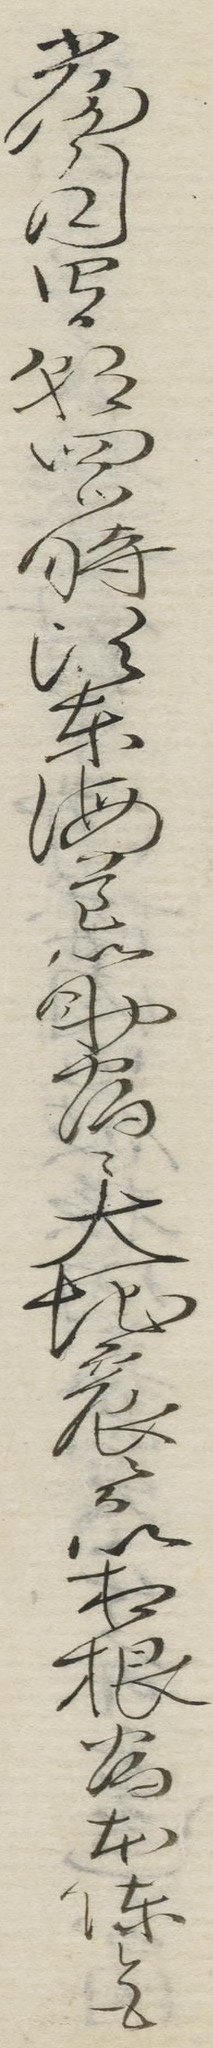當月四日朝四ッ時頃東海道筋宿々大地震ニ而箱根宿本陣とも
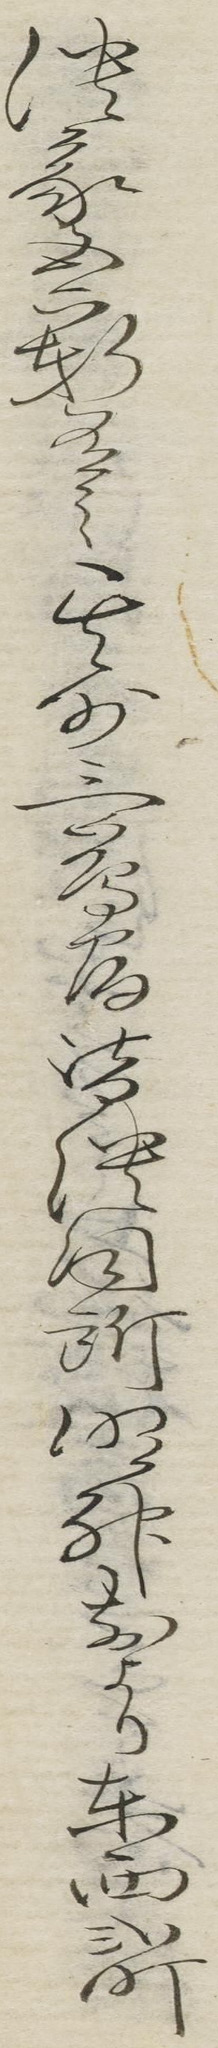潰家五六軒有之其外三嶌宿皆潰同所明神前より東西弐町

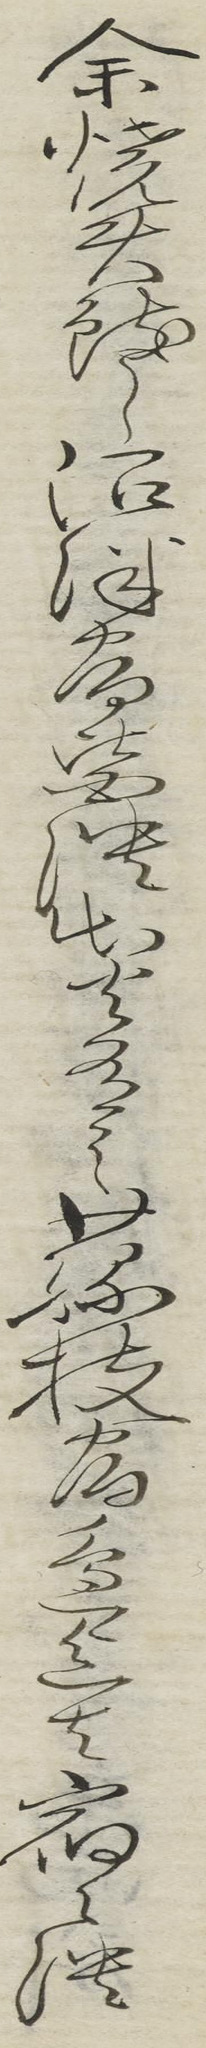余焼失致し沼津宿皆潰出火有之藤枝宿辺迄は宿〻潰
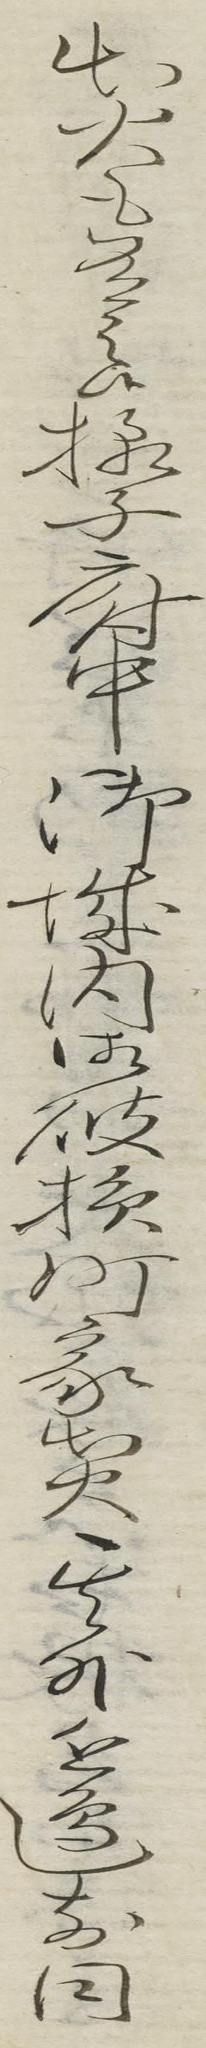出火も有之候様子府中御城内御破損町家出火其外近辺前同
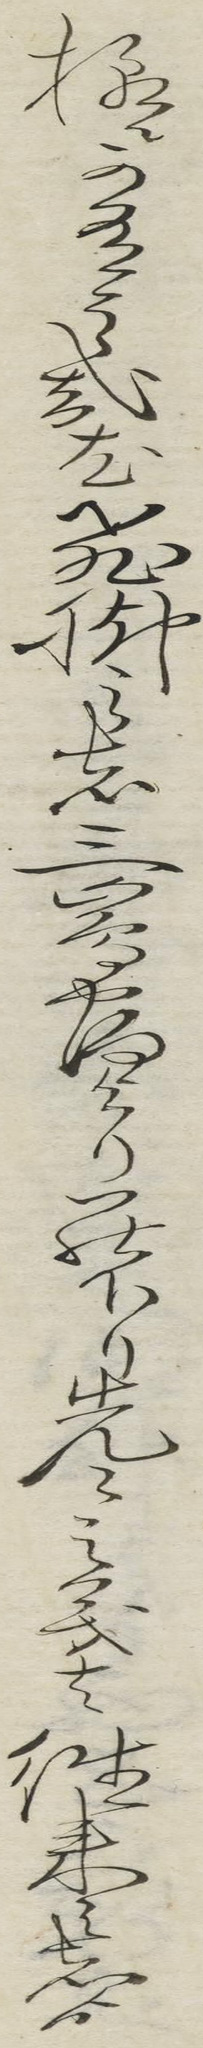様ニ可有之候哉尤飛脚之者三嶌宿より罷下り先〻之義は往来之者ゟ
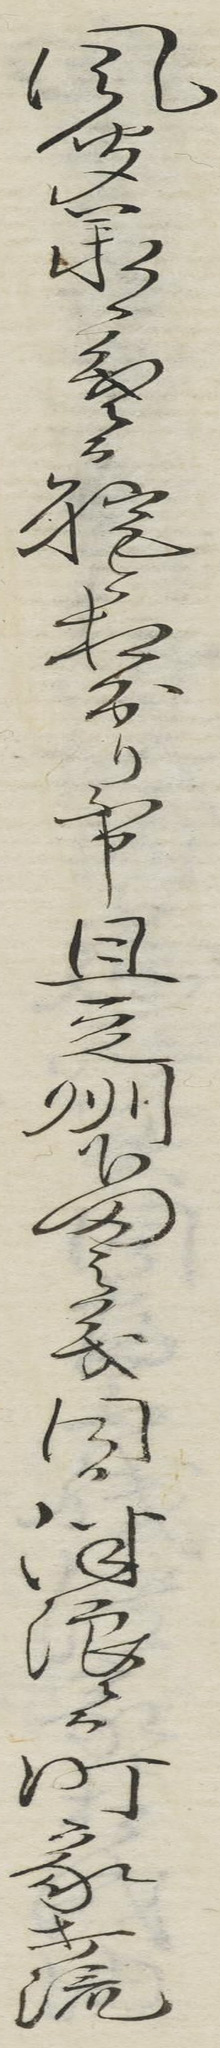風聞承候義ニ而聢と相分り不申且豆州下田之義同日津浪ニ而町家打流
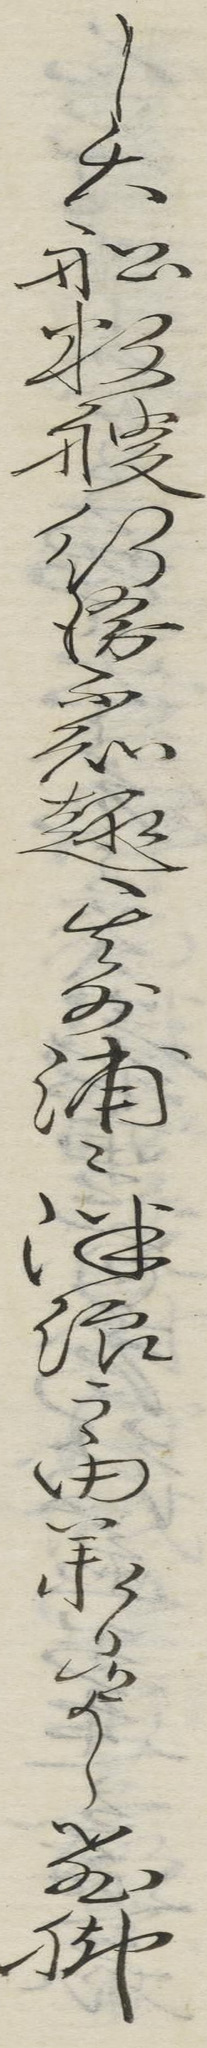し大船数艘行衛不知趣其外浦〻津浪之由承り候よし飛脚
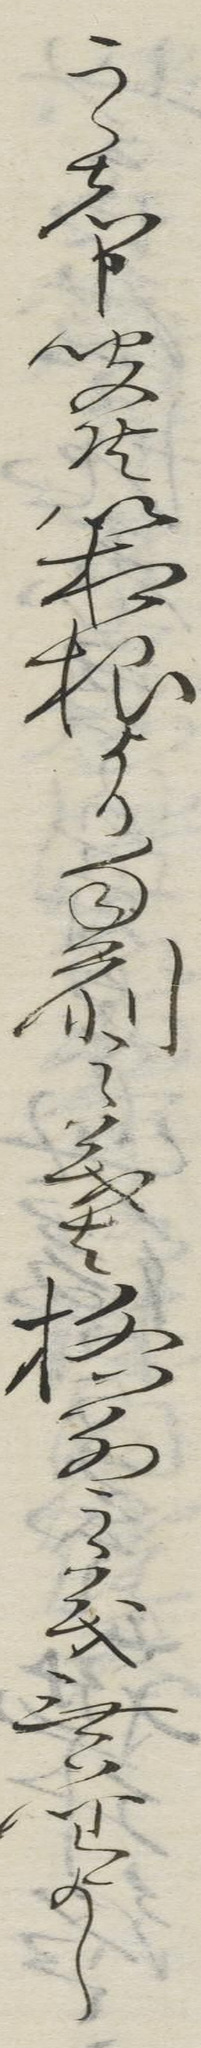之者申聞候箱根より手前之義は格別之義無御座よし
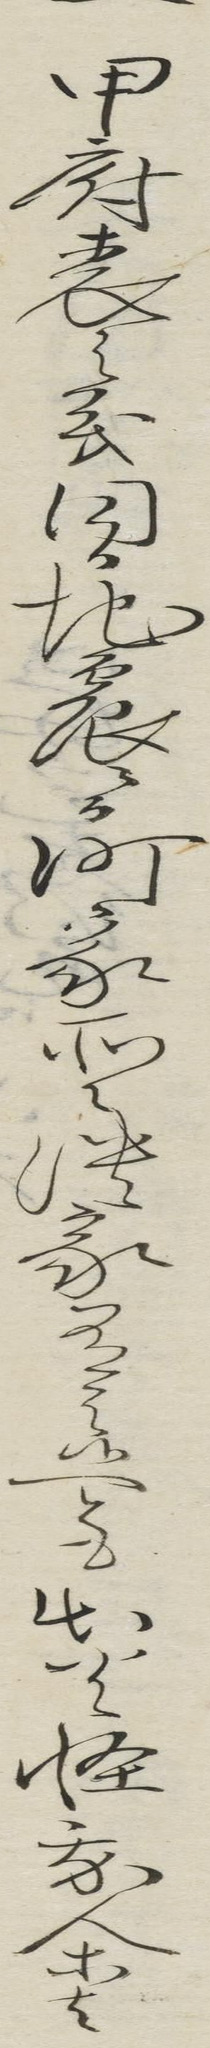一甲府表之義同日地震ニ而町家所〻潰家有之候へとも出火怪我人等は
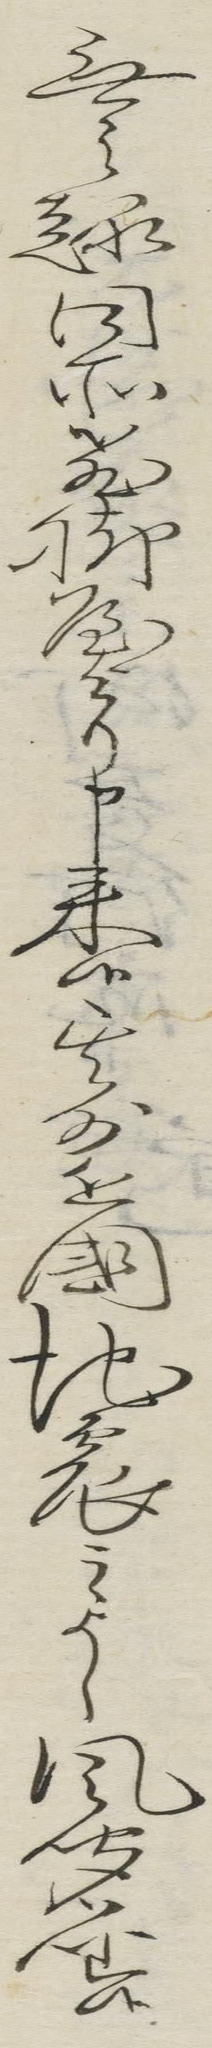無之趣同所飛脚屋より申来候其外近国地震之よし風聞御座候
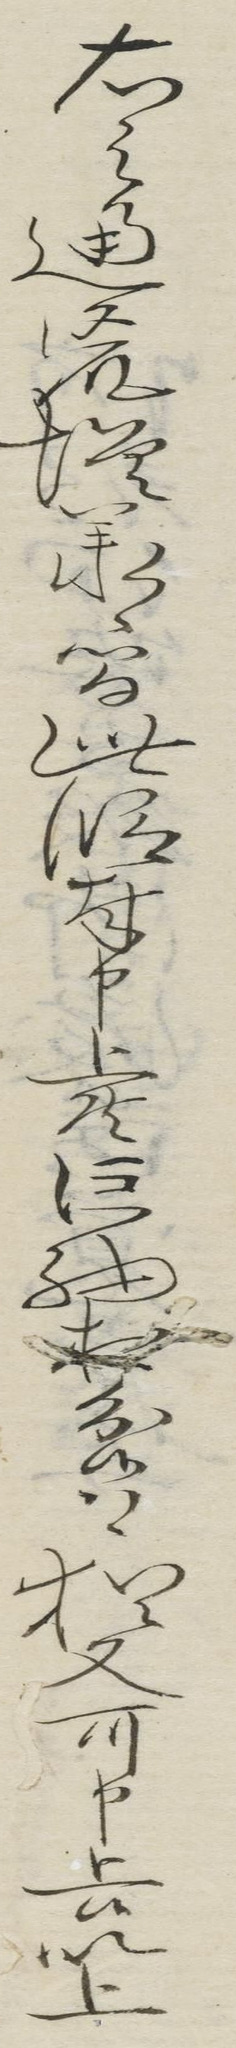右之通荒増承候間此段奉申上候巨細相分候ハヽ猶又可申上候以上
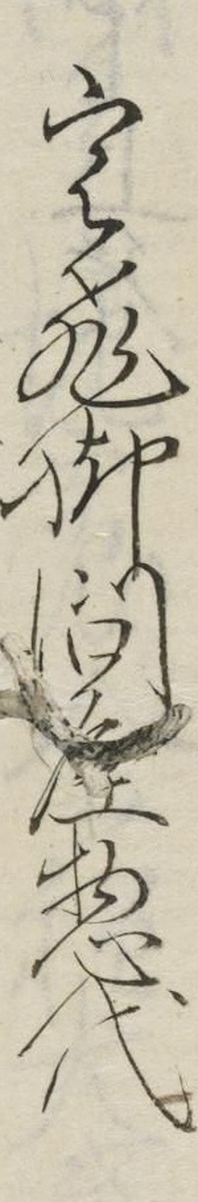定飛脚問屋惣代
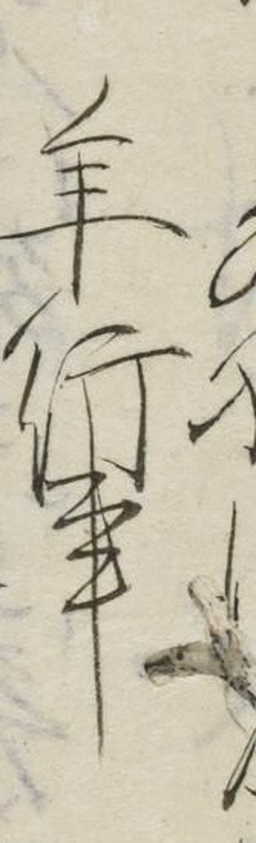年行事
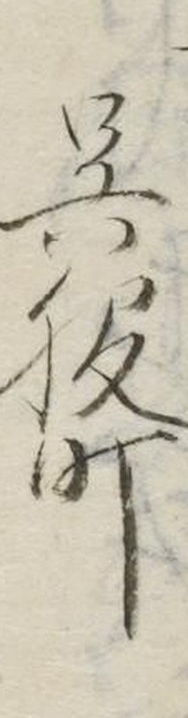呉服町
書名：大地震實録
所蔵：東京大学地震研究所図書室 Earthquake Research Institute Library, The University of Tokyo, JAPAN
